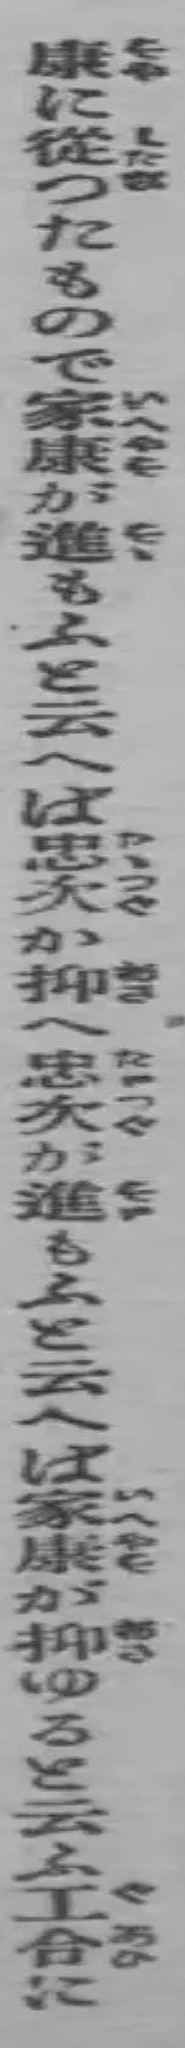康に従つたもので家康が進もふと云へば忠次か抑へ忠次が進もふと云へば家康が抑ゆると云ふ工合に
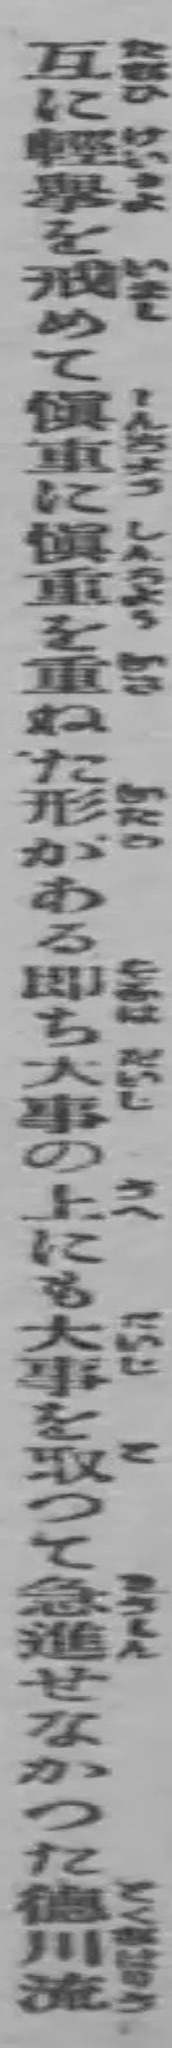互に軽挙を戒めて慎重に慎重を重ねた形がある即ち大事の上にも大事を取つて急進せなかつた徳川流
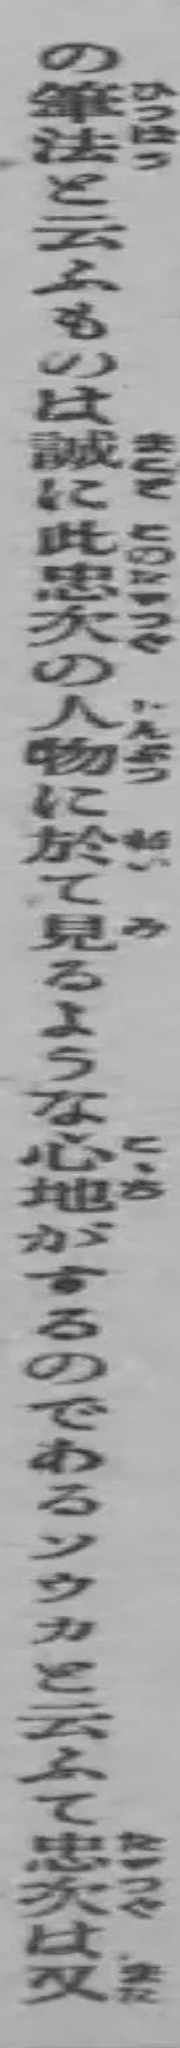の筆法と云ふものは誠に此忠次の人物に於て見るような心地がするのであるソウカと云ふて忠次は又
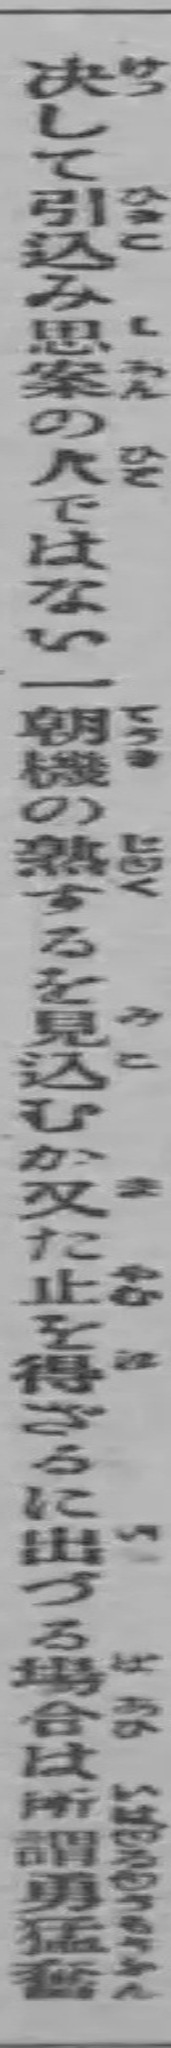決して引込み思案の人ではない一朝機の熟するを見込むか又た止を得ざるに出づる場合は所謂勇猛奮
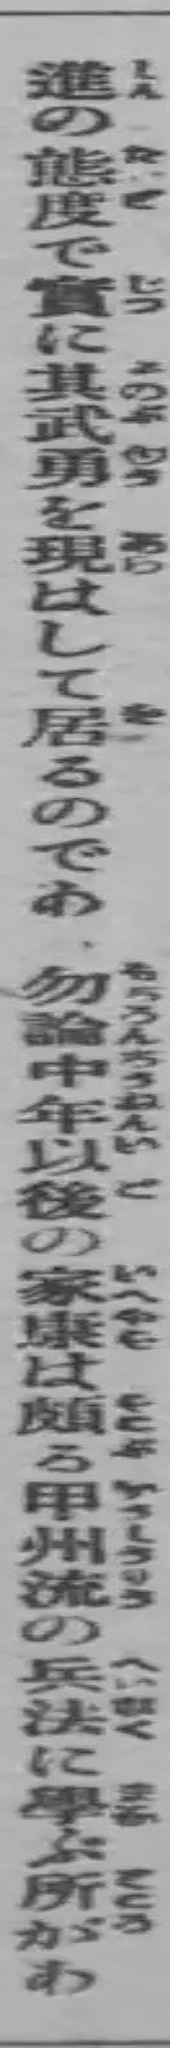進の態度で実に其武勇を現はして居るのである勿論中年以後の家康は頗る甲州流の兵法に学ぶ所があ
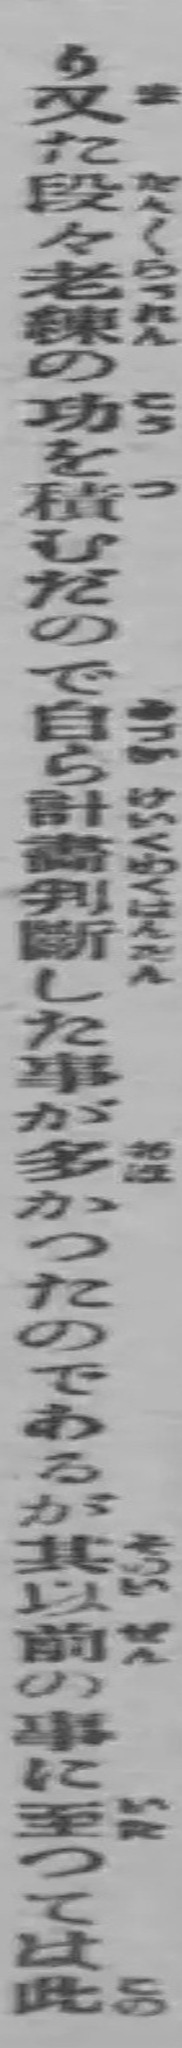り又た段々老練の功を積むだので自ら計画判断した事が多かつたのであるが其以前の事に至つては此
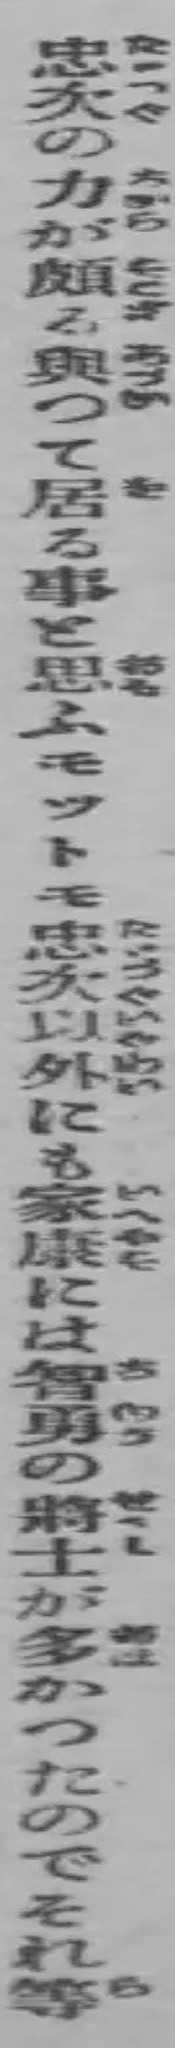忠次の力が頗る与つて居る事と思ふモツトモ忠次以外にも家康には智勇の将士が多かつたのでそれ等
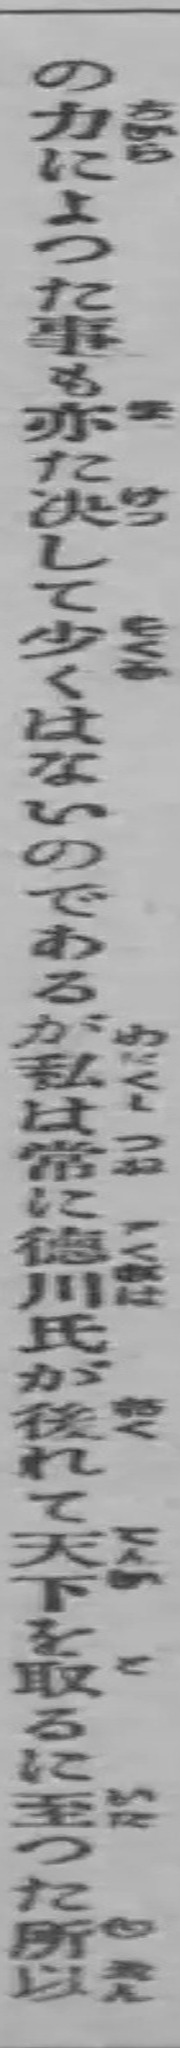の力によつた事も亦た決して少くはないのであるが私は常に徳川氏が後れて天下を取るに至つた所以
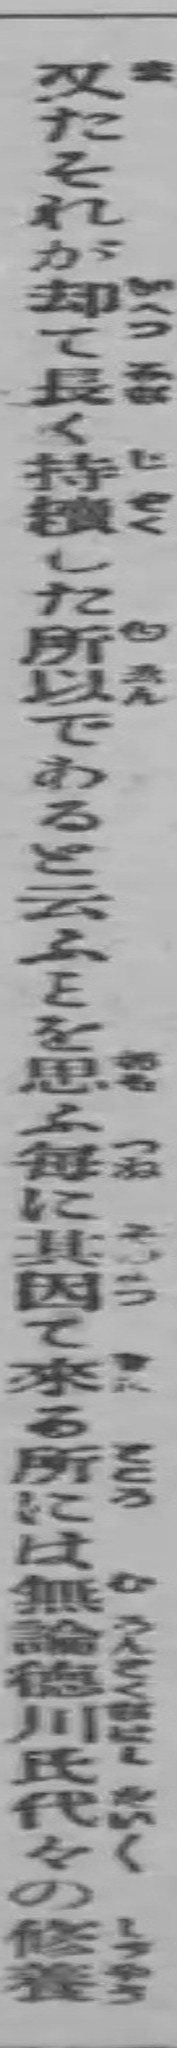又たそれが却て長く持続した所以であると云ふことを思ふ毎に其因て来る所には無論徳川氏代々の修養
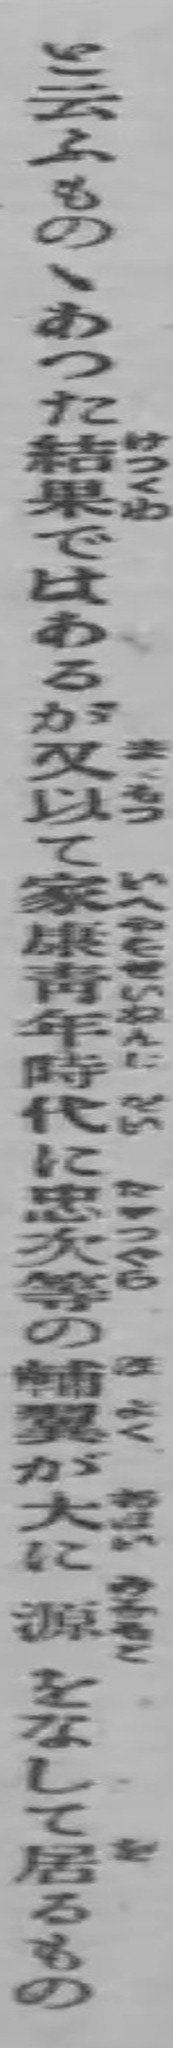と云ふものゝあつた結果ではあるが又以て家康青年時代に忠次等の輔翼が大に源をなして居るもの
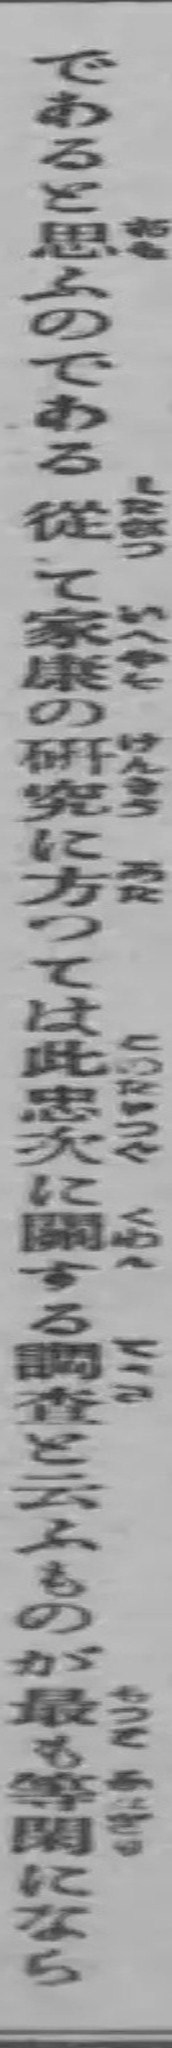であると思ふのである従て家康の研究に方つては此忠次に関する調査と云ふものが最も等閑になら
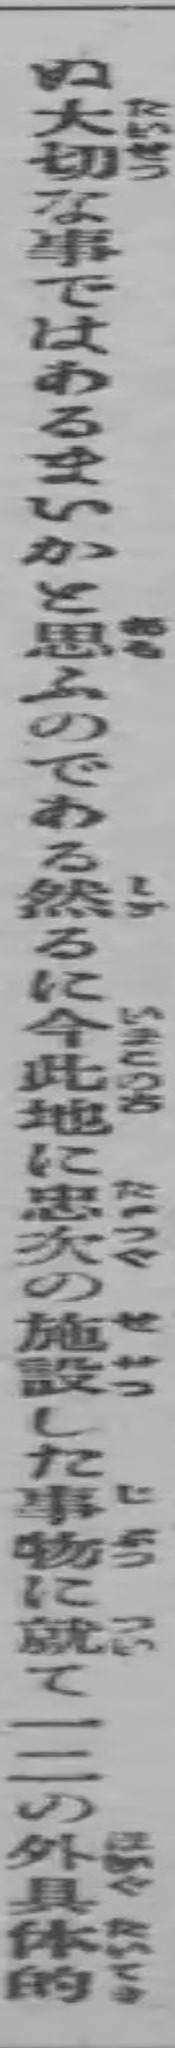ぬ大切な事ではあるまいかと思ふのである然るに今此地に忠次の施設した事物に就て一二の外具体的
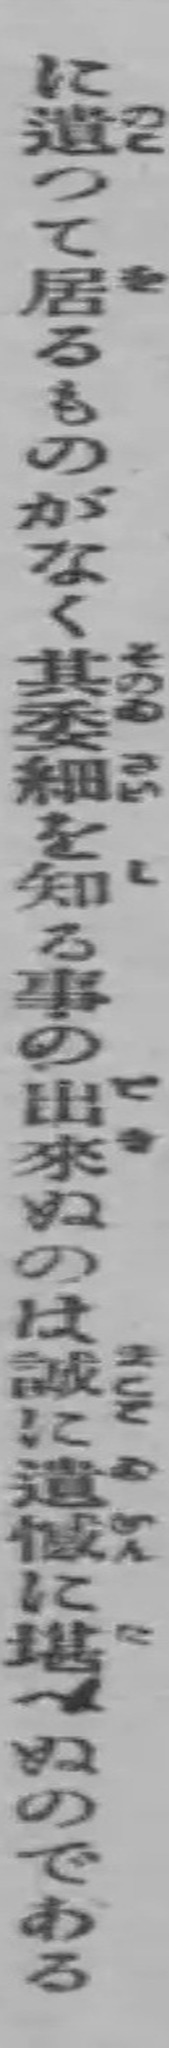に遺つて居るものがなく其委細を知る事の出来ぬのは誠に遺憾に堪へぬのである
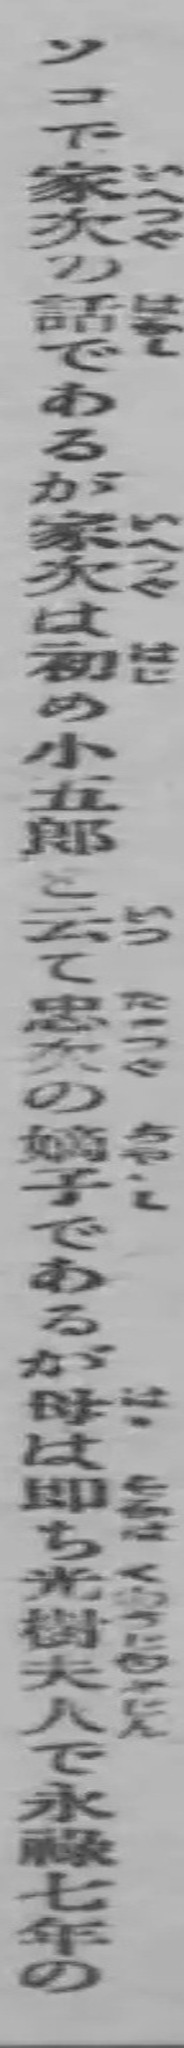酒井家次ソコで家次の話であるが家次は初め小五郎と云て忠次の嫡子であるが母は即ち光樹夫人で永禄七年の
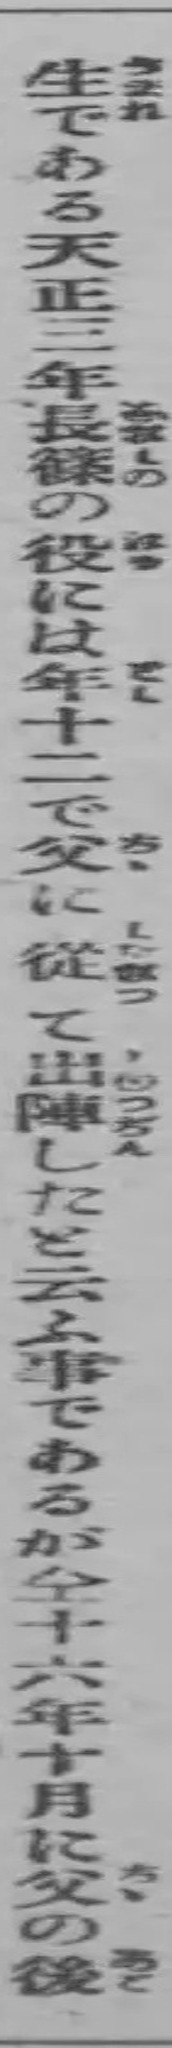生である天正三年長篠の役には年十二で父に従て出陣したと云ふ事であるが仝十六年十月に父の後
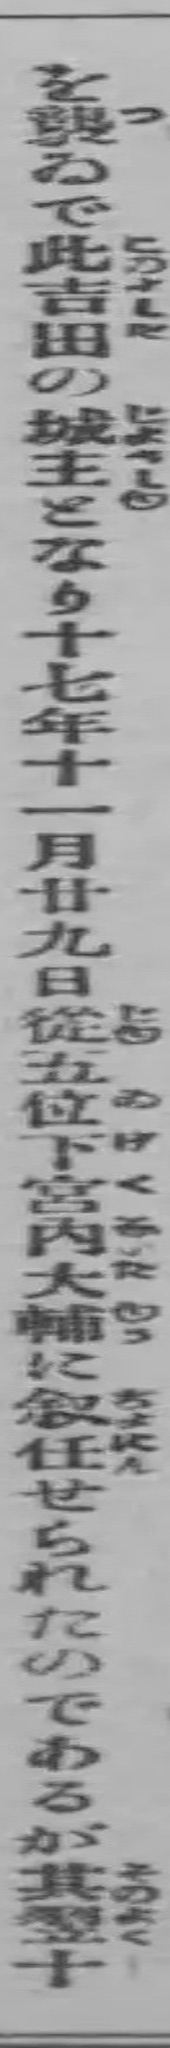を襲ゐで此吉田の城主となり十七年十一月廿九日従五位下宮内大輔に叙任せられたのであるが其翌十
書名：豊橋市史談
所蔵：国立国会図書館 National Diet Library, JAPAN
